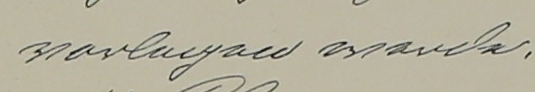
vorlegen werde.
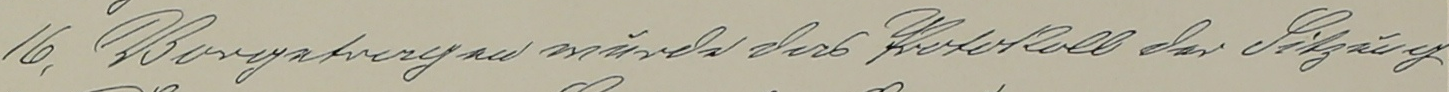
16. Vorgetragen wurde das Protokoll der Sitzung
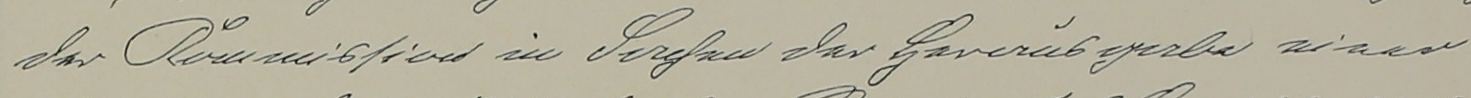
der Kommission in Sachen der Herausgabe einer
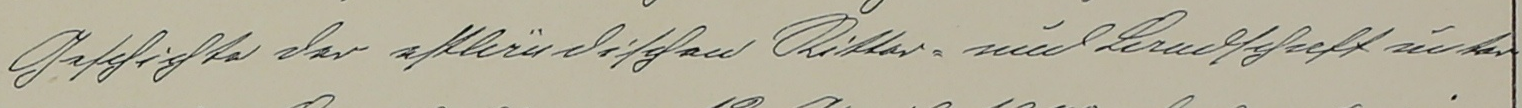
Geschichte der estländischen Ritter- und Landschaft unter
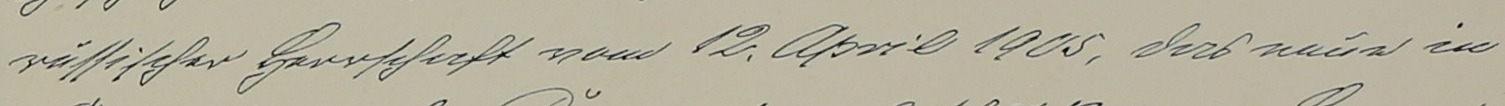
russischer Herrschaft vom 12. April 1905, das neue in
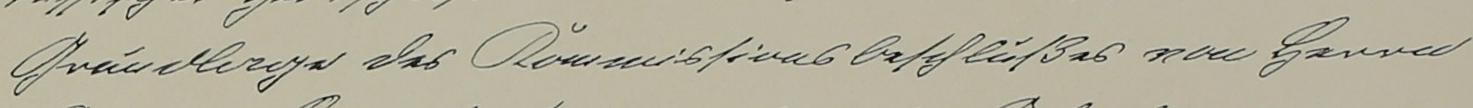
Grundlage des Kommissionsbeschlußes von Herrn
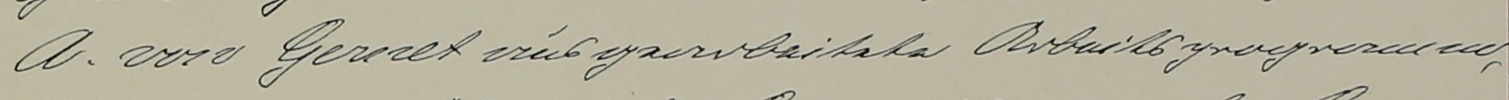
A. von Gernet ausgearbeitete Arbeitsprogramm,
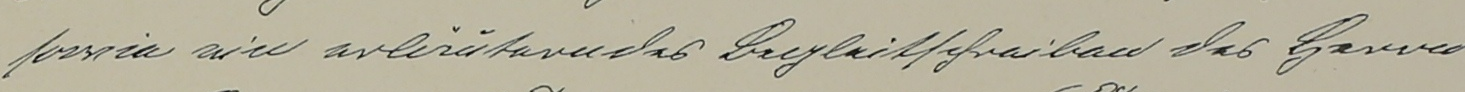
sowie ein erläuterndes Begleitschreiben des Herrn
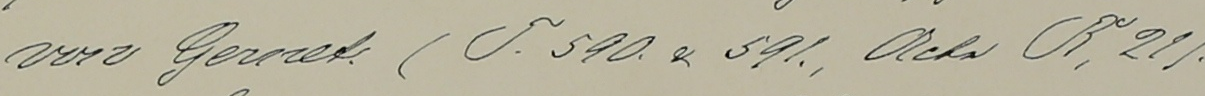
von Gernet (T. 590 & 591; Acte R.21).
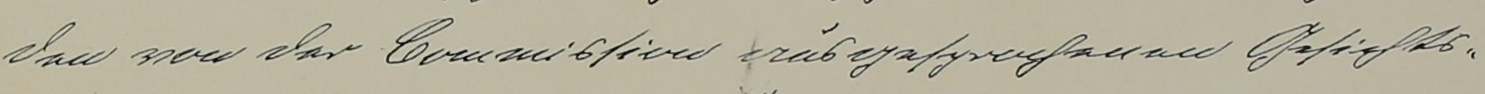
den von der Commission ausgesprochenen Gesichts-
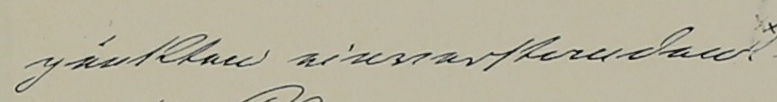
punkten einverstanden
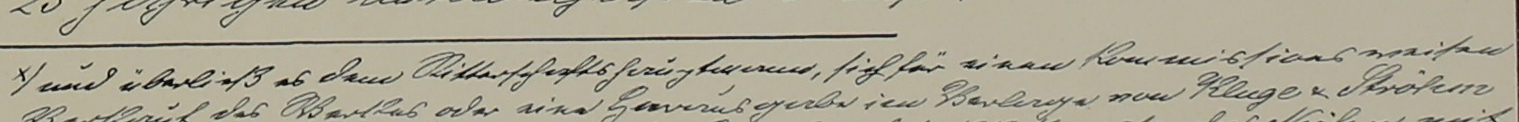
und überließ es dem Ritterschaftshauptmann, sich für einen kommissionsweisen
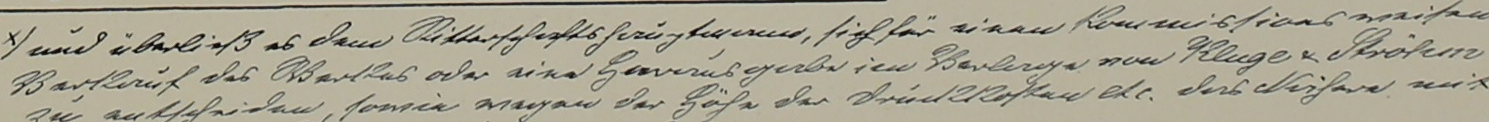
Verkauf des Werkes oder eine Herausgabe im Verlage von Kluge & Ströhm
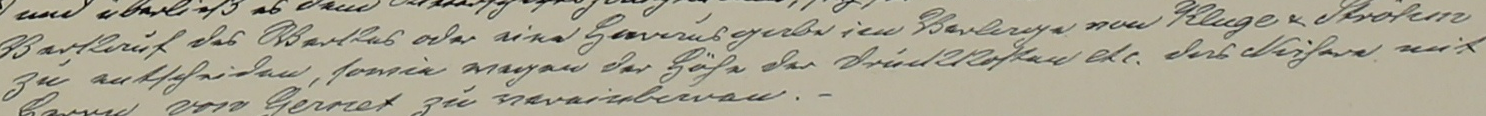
zu entscheiden, sowie wegen der Höhe der Druckkosten etc. das Nähere mit
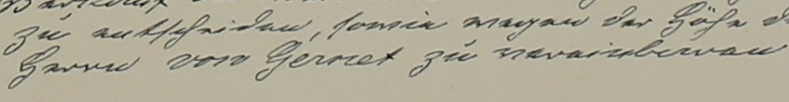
Herrn von Gernet zu vereinbaren.
